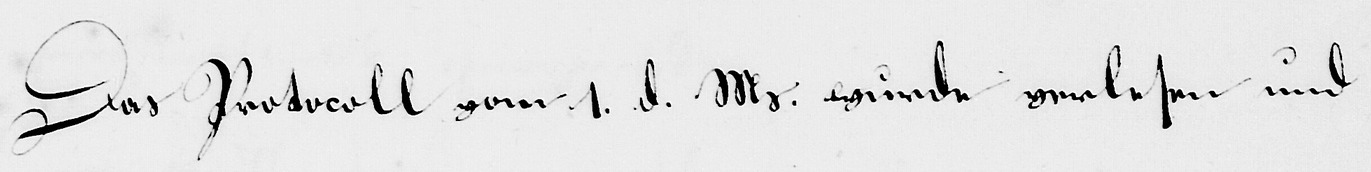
Das Protocoll vom 1. d. Ms. wurde verlesen und
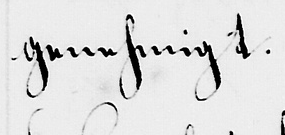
genehmigt.
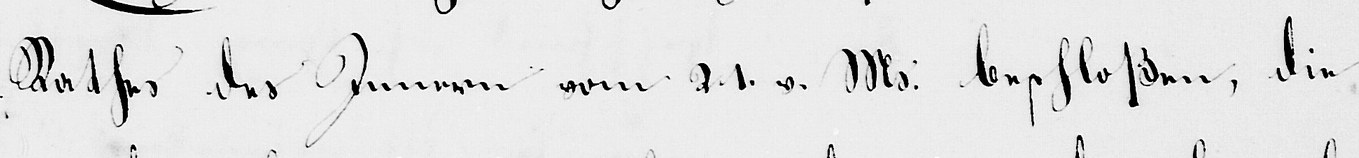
Rathes des Innern vom 21. v. Ms. beschloßen, die
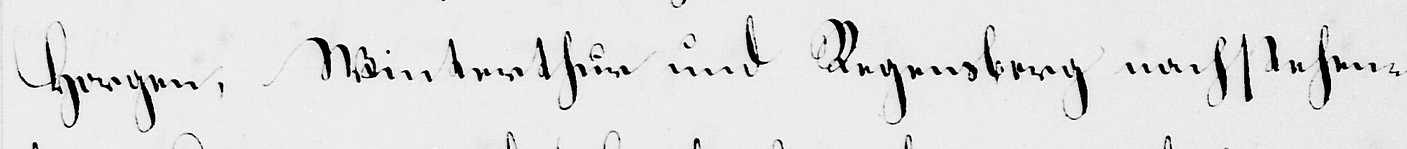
Horgen, Winterthur und Regensberg nachstehen¬
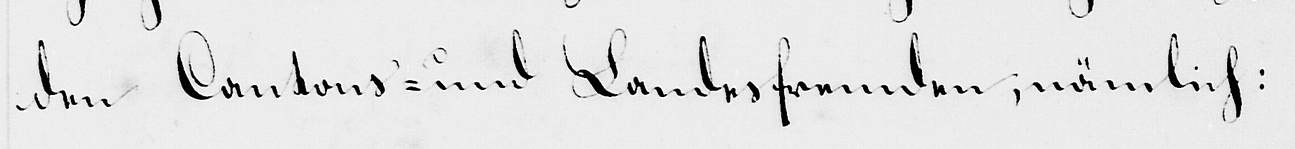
den Cantons- und Landesfremden; nämlich:
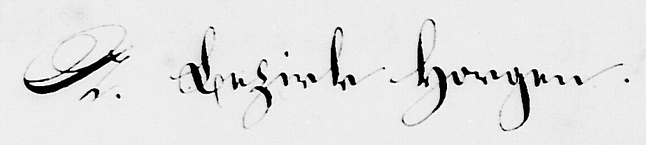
A. Bezirk Horgen.
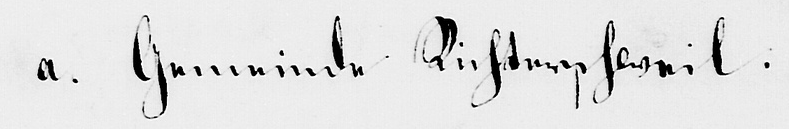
a. Gemeinde Richterschweil.
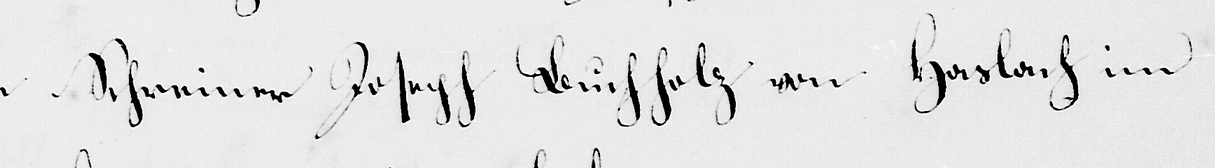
Schreiner Joseph Buchholz von Haslach im
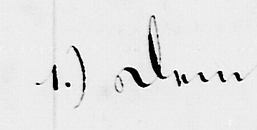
1.) dem
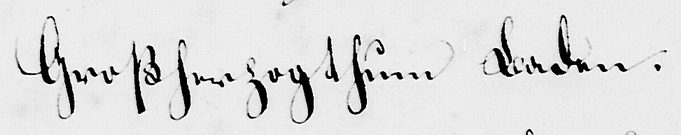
Großherzogthum Baden.
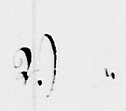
2.) “
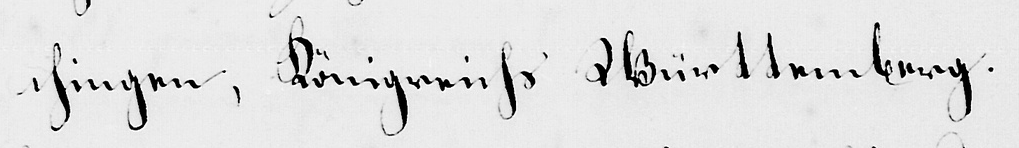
chingen, Königreichs Württemberg.
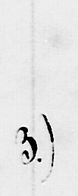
3.)
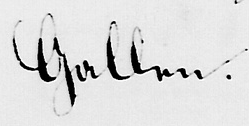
Gallen.
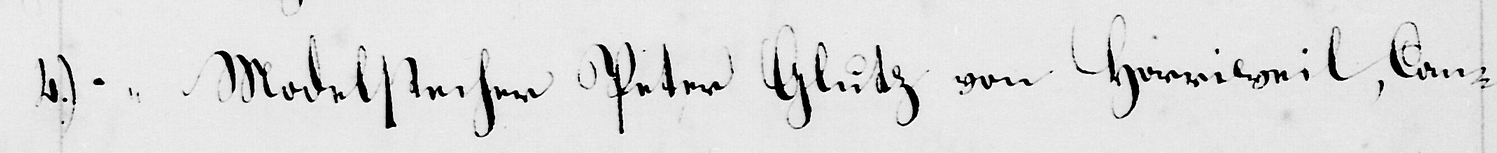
4.) “ Modelstecher Peter Glutz von Horriweil, Can-
